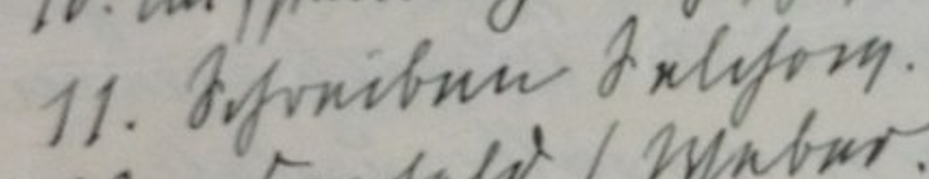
11. Schreiben Selchom
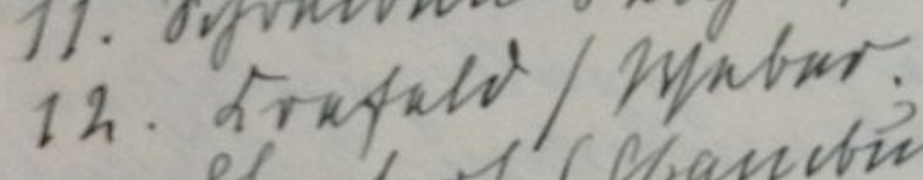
12. Krefeld / Weber
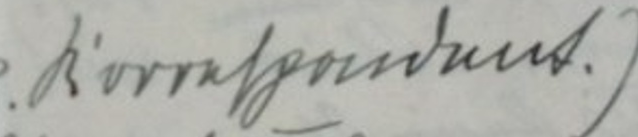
korrespondent
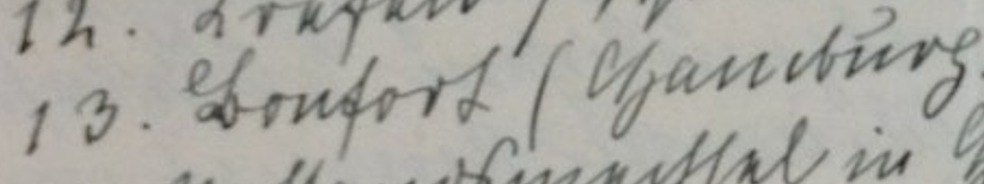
13. Lonfort / Hamburg
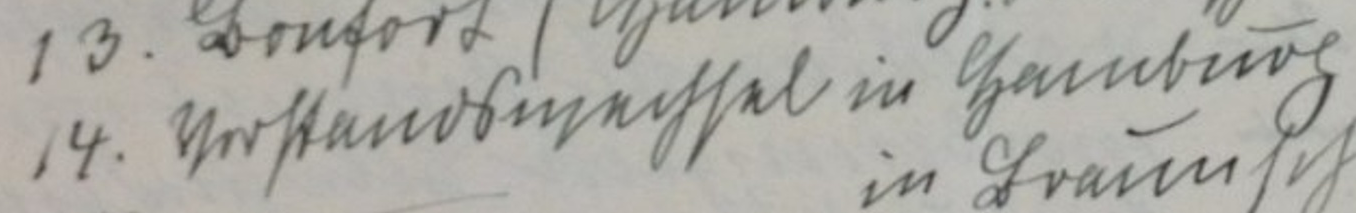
14. Vorstandswechsel in Hamburg
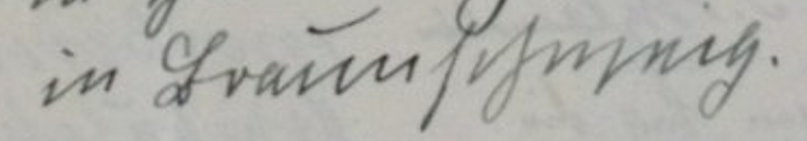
in Braunschweig
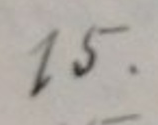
15.
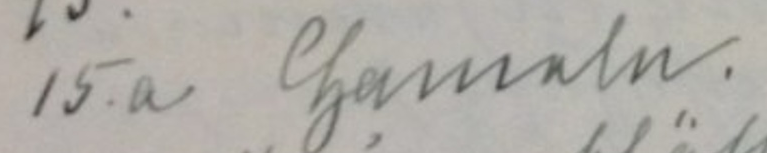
15.a Hameln
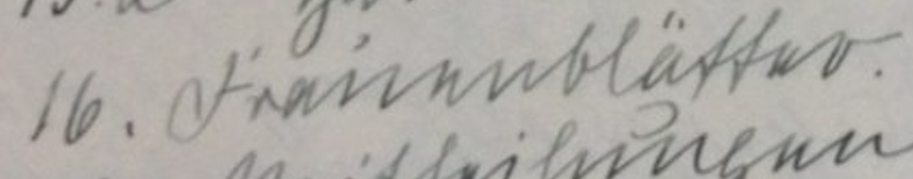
16. Frauenblätter
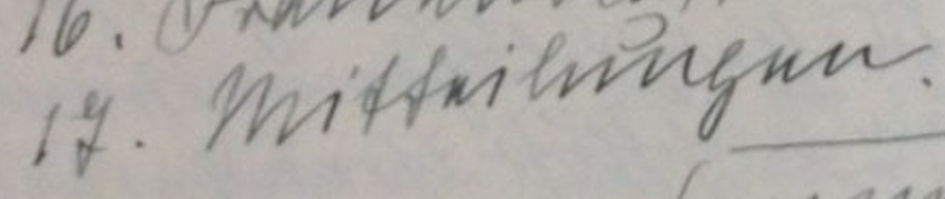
17. Mitteilungen
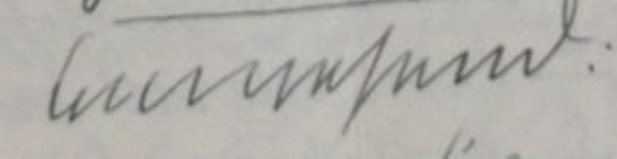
Anwesend
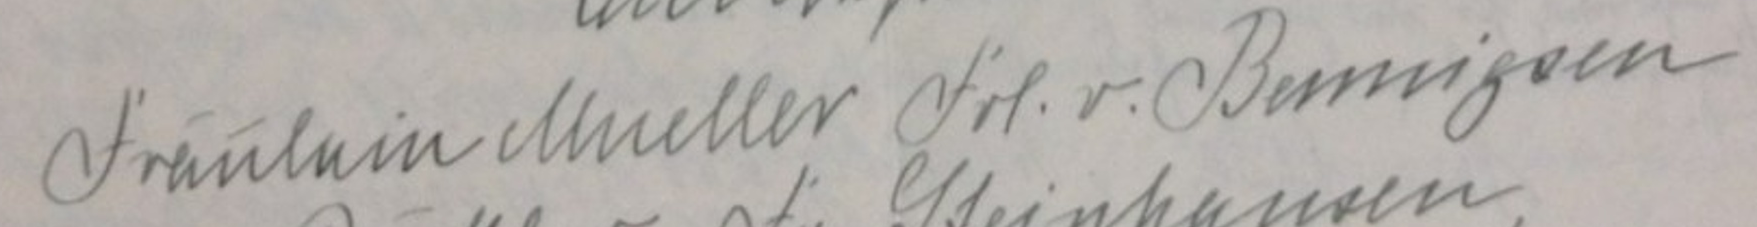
Fräulein Mueller Frl. v. Bennigsen
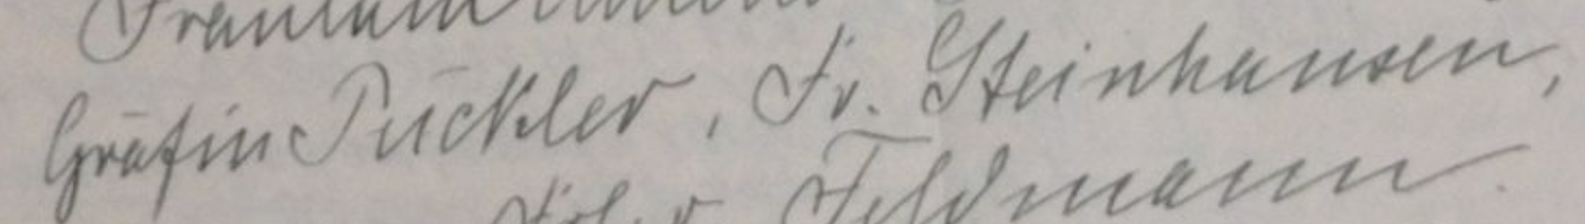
Gräfin Pückler, Fr. Steinhausen,
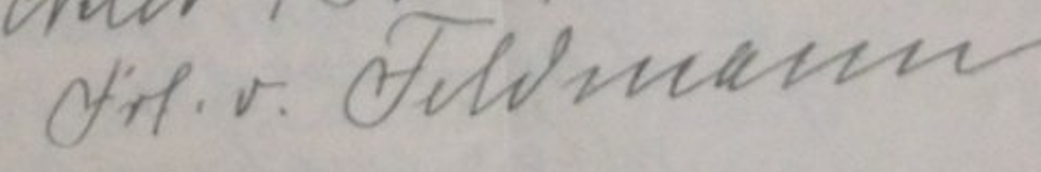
Frl. v. Feldmann
